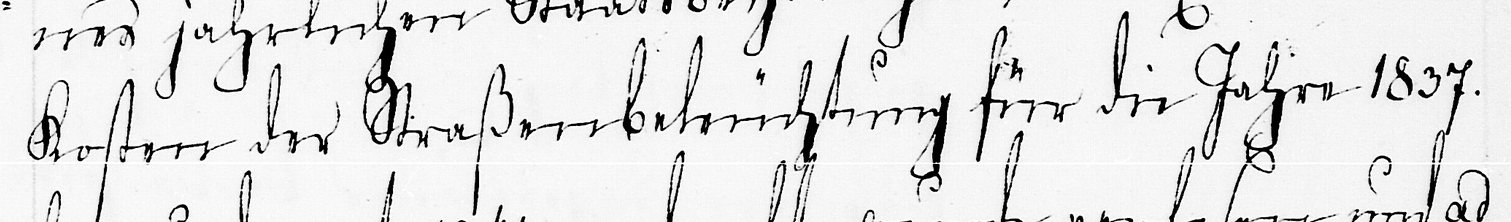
Kosten der Straßenbeleuchtung für die Jahre 1837.
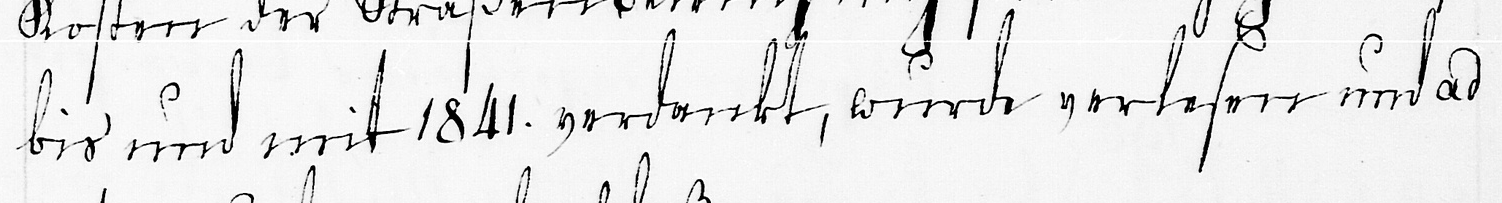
bis und mit 1841. verdankt, wurde verlesen und ad
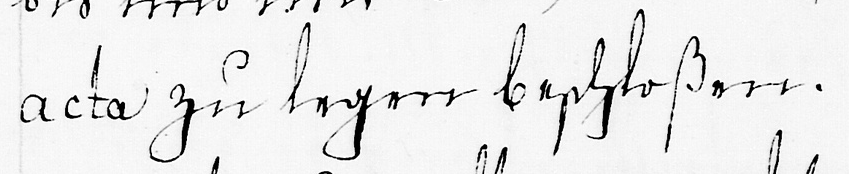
acta zu legen beschloßen.
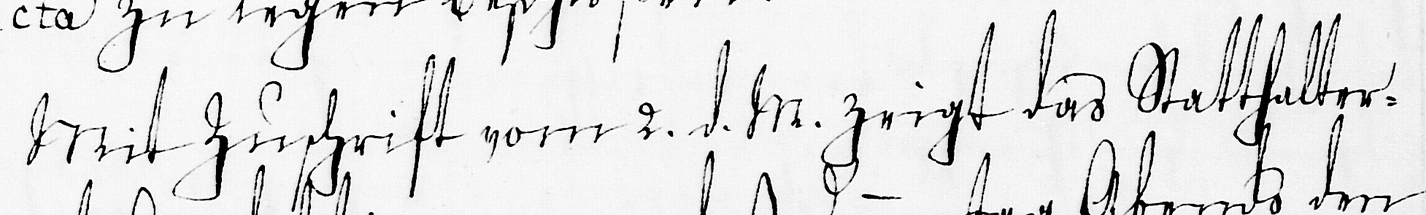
Mit Zuschrift vom 2. d. M. zeigt das Statthalter¬
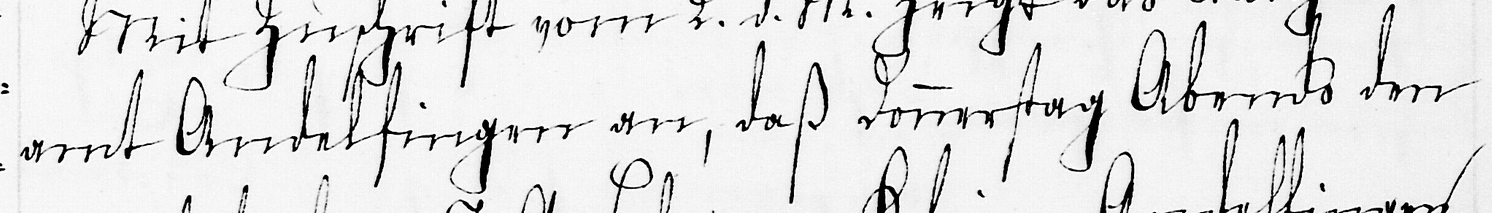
amt Andelfingen an, daß Donnerstag Abends den
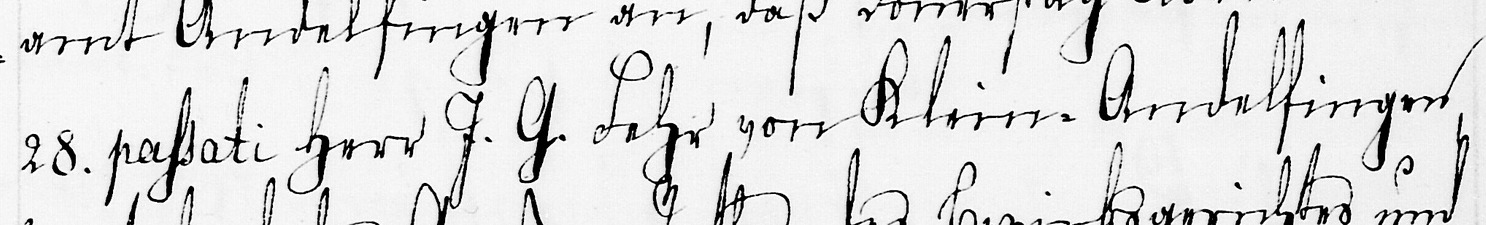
28. passati Herr J. G. Fehr von Klein-Andelfingen,
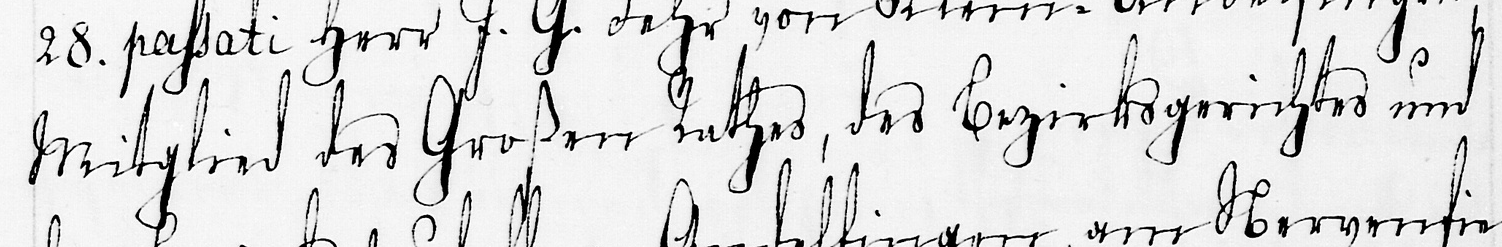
Mitglied des Großen Rathes, des Bezirksgerichtes und
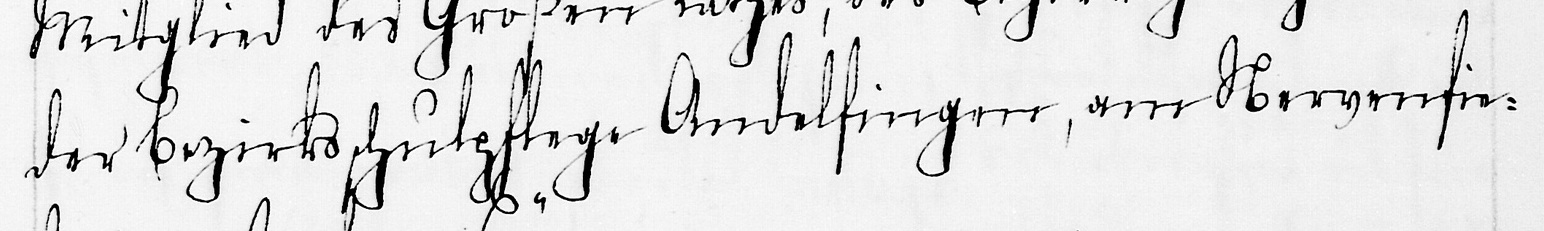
der Bezirksschulpflege Andelfingen, am Nervenfie¬
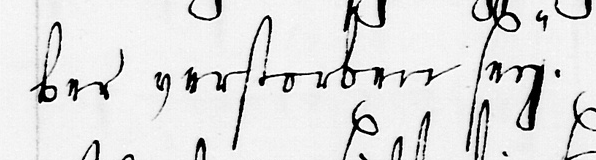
ber verstorben sey.
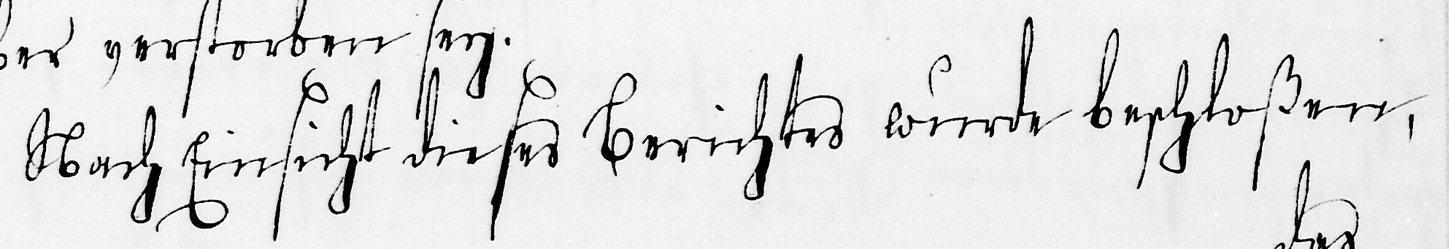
Nach Einsicht dieses Berichtes wurde beschloßen,
